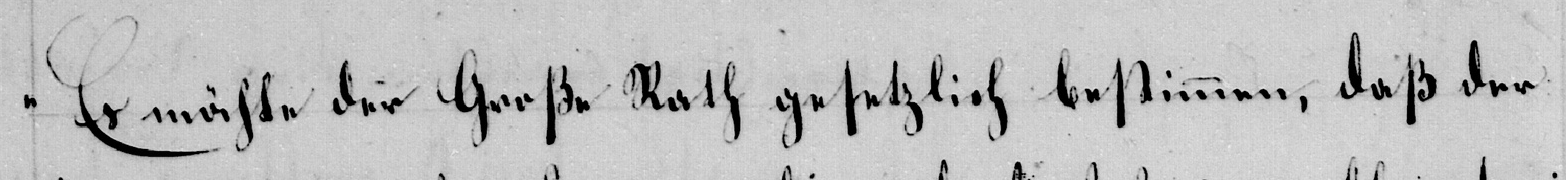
„Es möchte der Große Rath gesetzlich bestimmen, daß der
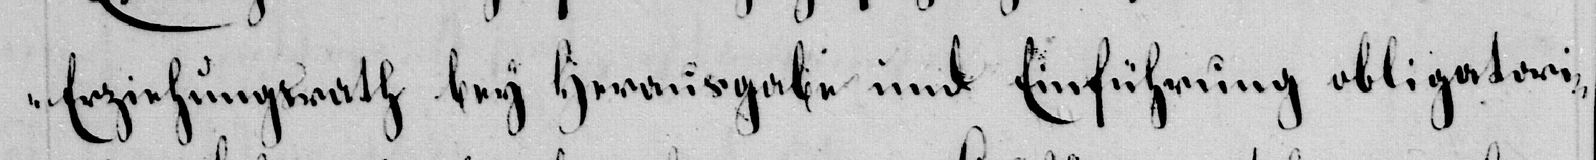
Erziehungsrath bey Herausgabe und Einführung obligator¬
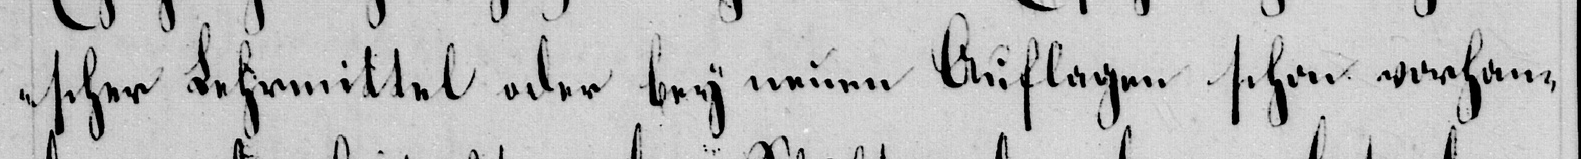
ischer Lehrmittel oder bey neuen Auflagen schon vorhan¬
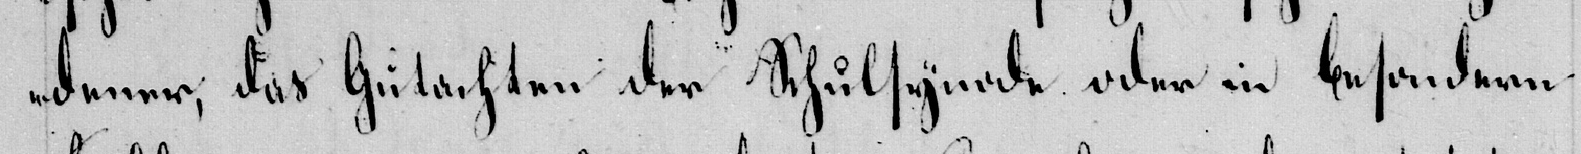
dener, das Gutachten der Schulsynode oder in besondern
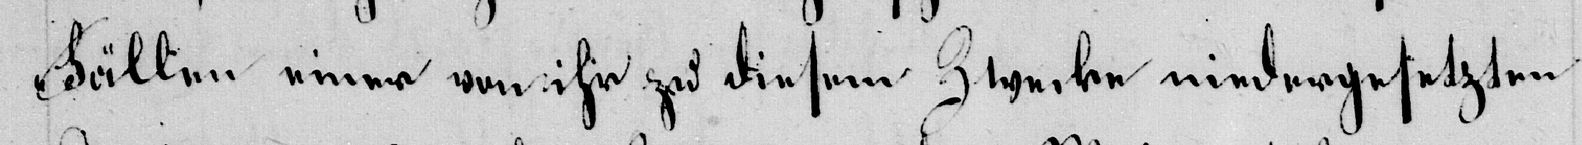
Fällen einer von ihr zu diesem Zwecke niedergesetzten
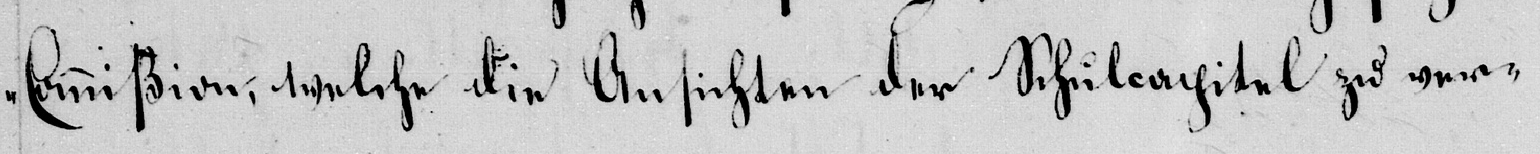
Commißion, welche die Ansichten der Schulcapitel zu ver¬
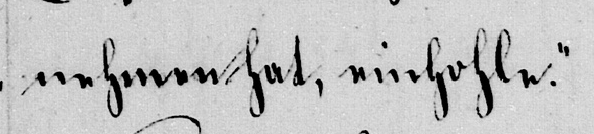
nehmen hat, einhohle.“
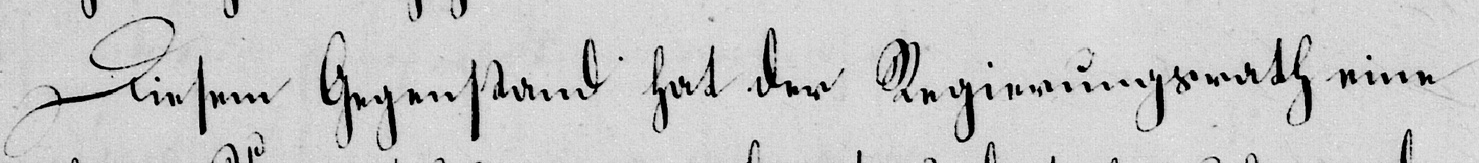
Diesem Gegenstand hat der Regierungsrath eine
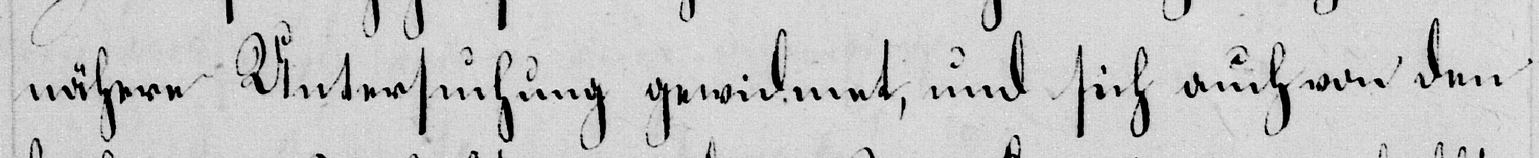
nähere Untersuchung gewidmet, und sich auch von den
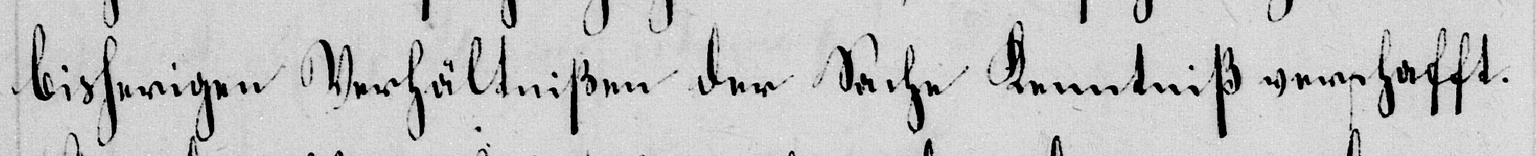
bisherigen Verhältnißen der Sache Kenntniß verschafft.
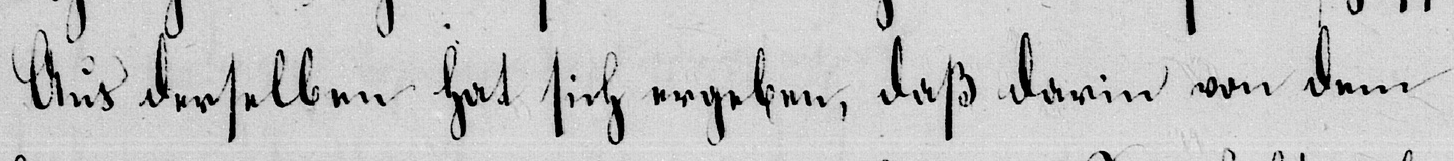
Aus derselben hat sich ergeben, daß darin von dem
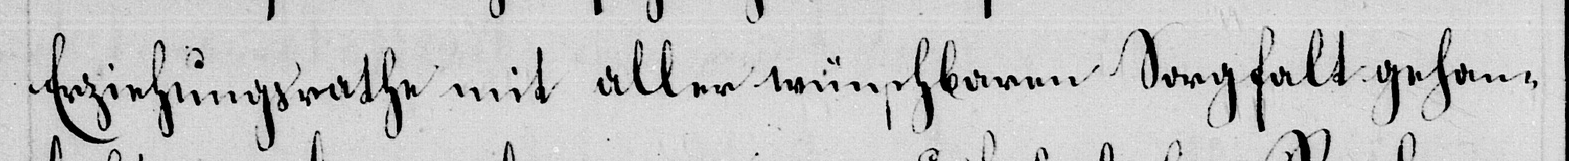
Erziehungsrathe mit aller wünschbaren Sorgfalt gehan¬
